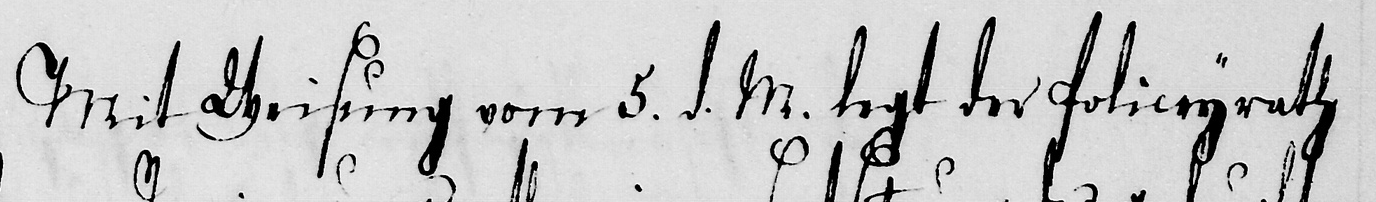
Mit Weisung vom 5. d. M. legt der Policeyrath
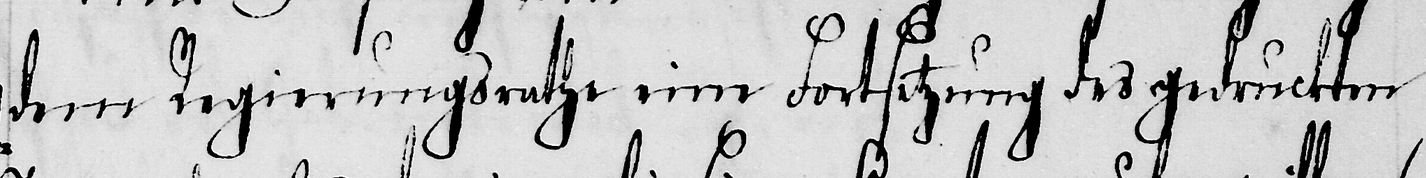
dem Regierungsrathe eine Fortsetzung des gedruckten
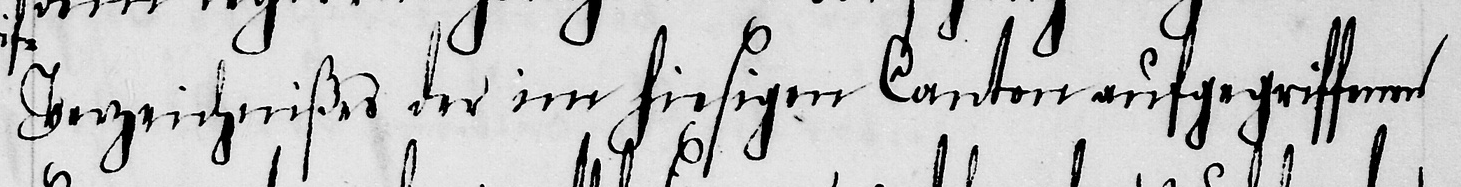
Verzeichnißes der im hiesigen Canton aufgegriffenen
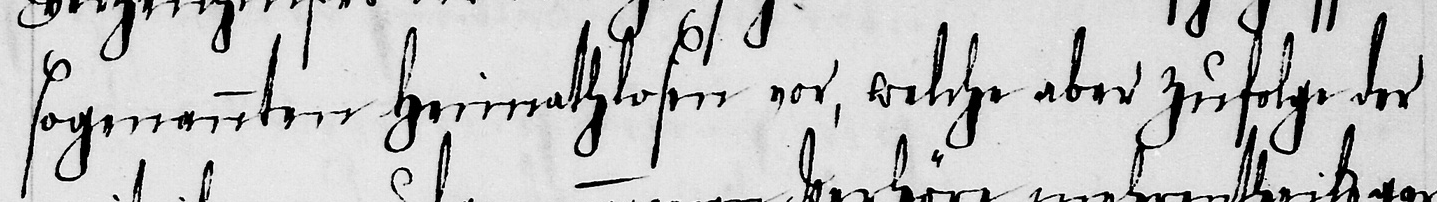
sogenannten Heimathlosen vor, welche aber zufolge der
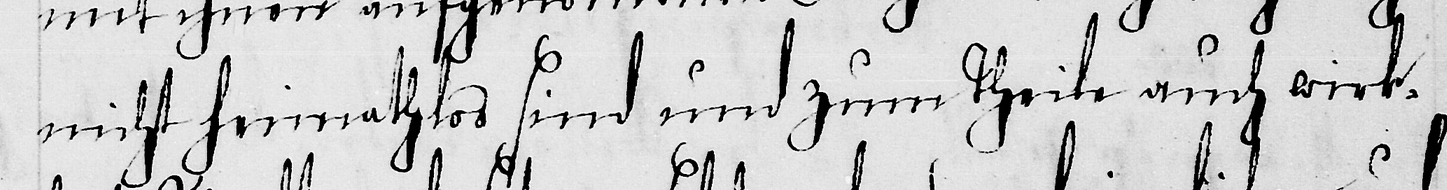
nicht Heimathlos sind und zum Theile auch wirk¬
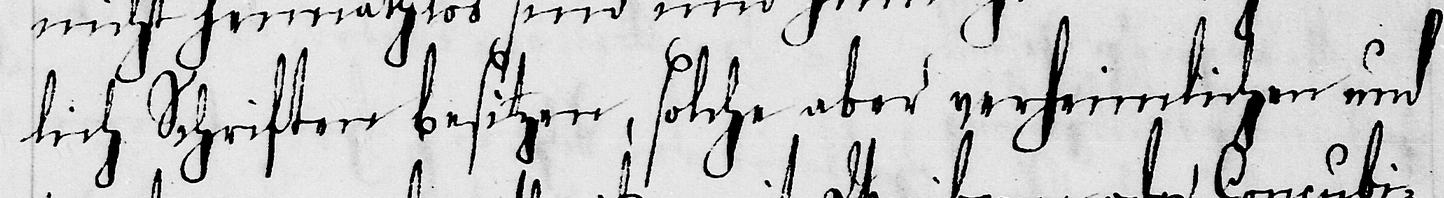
lich Schriften besitzen, solche aber verheimlichen und
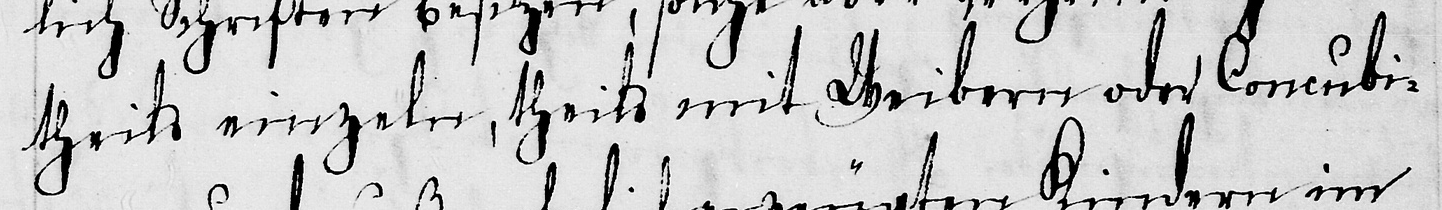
theils einzeln, theils mit Weibern oder Concubi¬
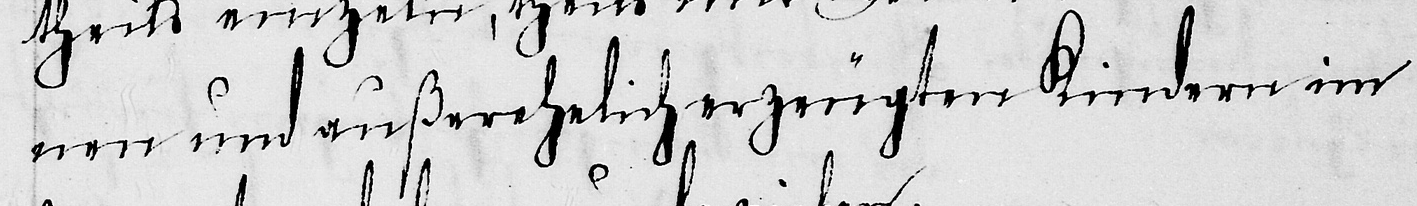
nen und außerehelich erzeugten Kindern im
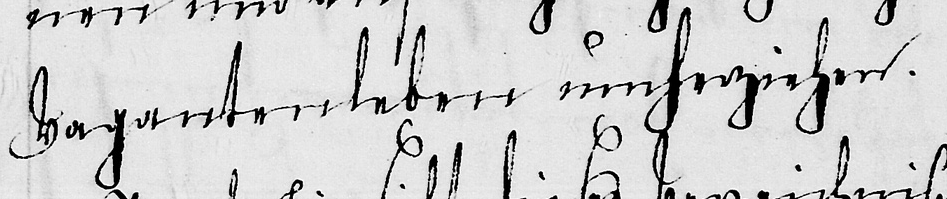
Vagantenleben umherziehen.
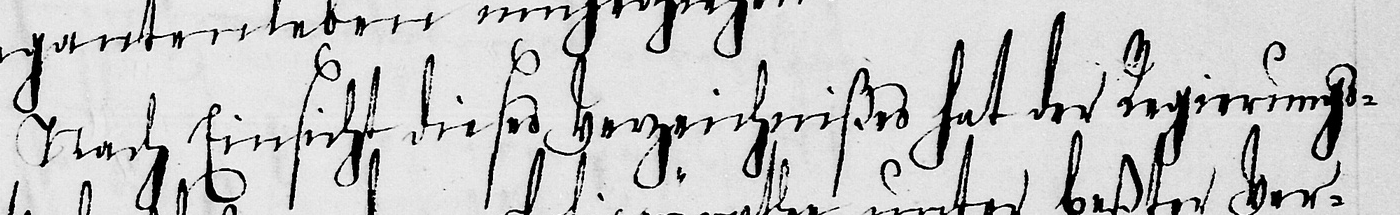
Nach Einsicht dieses Verzeichnißes hat der Regierungs¬
